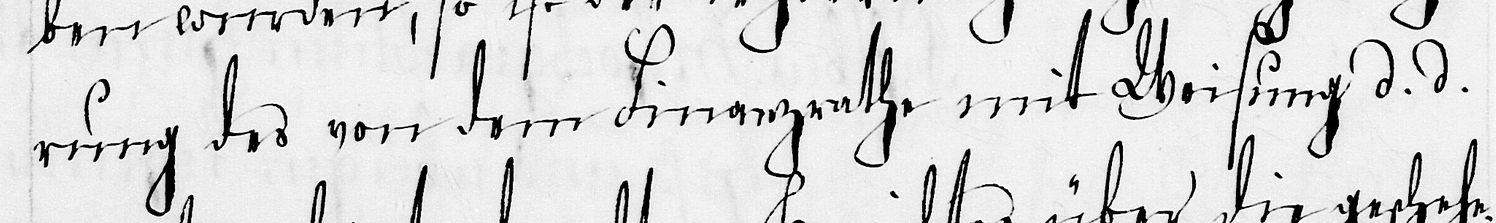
rung des von dem Finanzrathe mit Weisung d. d.
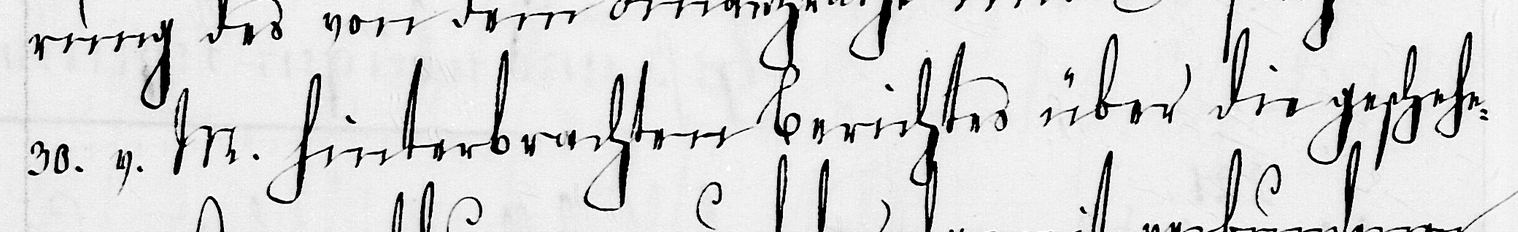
30. v. M. hinterbrachten Berichtes über die geschehe¬
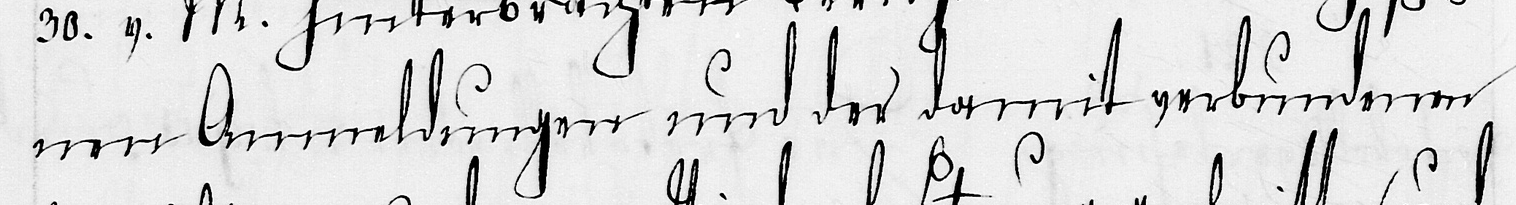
nen Anmeldungen und der damit verbundenen
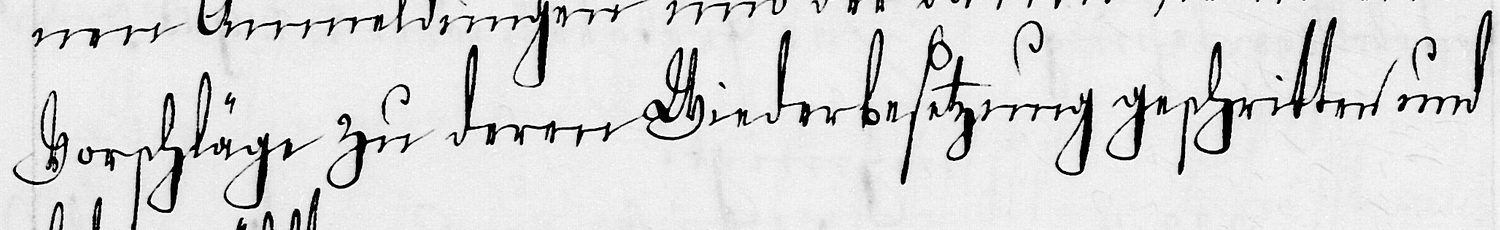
Vorschläge zu deren Wiederbesetzung geschritten und
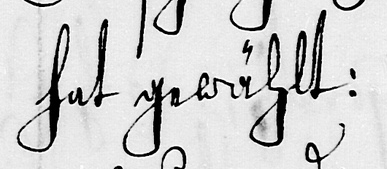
hat gewählt:
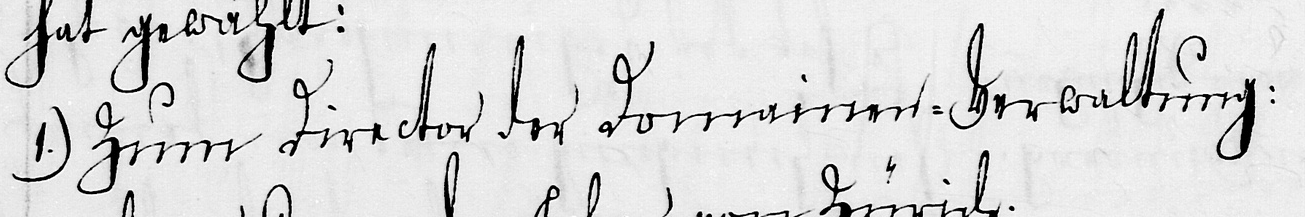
1.) Zum Director der Domainen-Verwaltung:
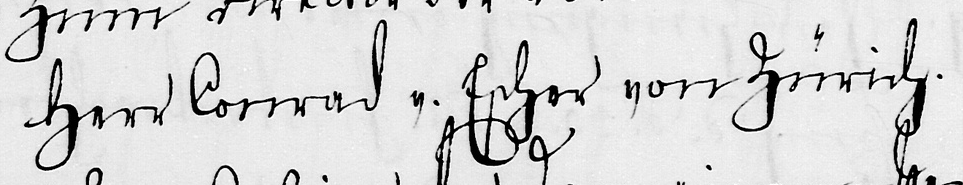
Herr Conrad v. Escher von Zürich.
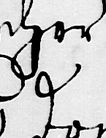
R.
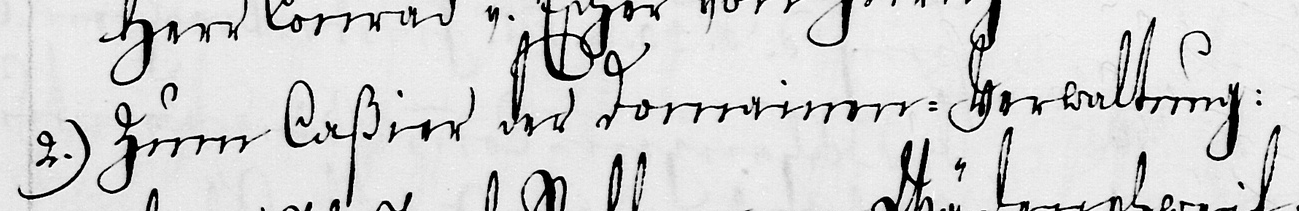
2.) Zum Caßier der Domainen-Verwaltung:
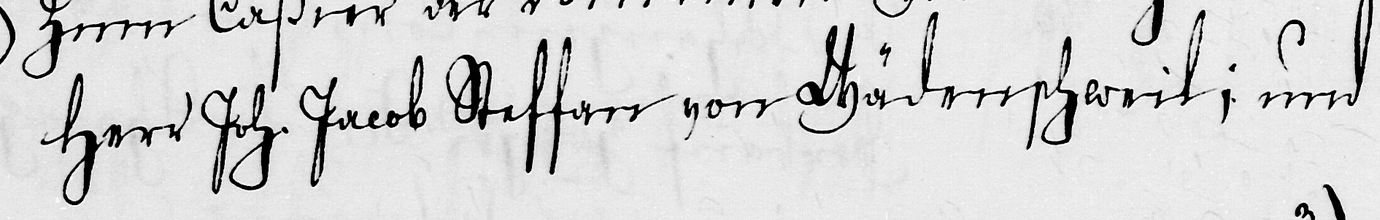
Herr Joh. Jacob Steffan von Wädenschweil; und
